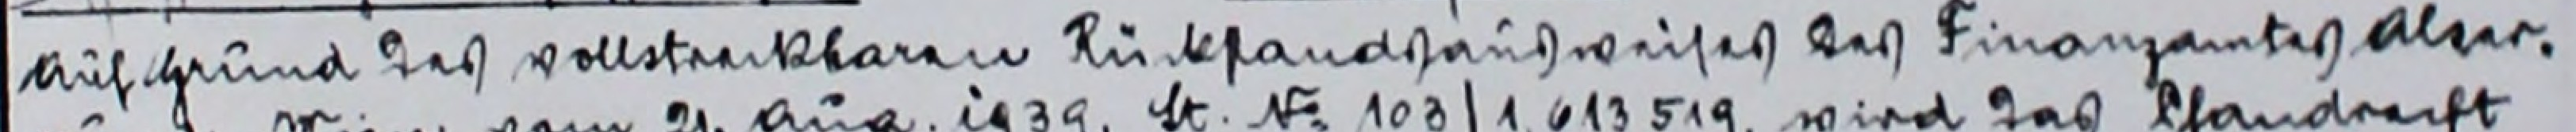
Auf Grund des vollstreckbaren Rückstandsausweises des Finanzamtes Alsen„
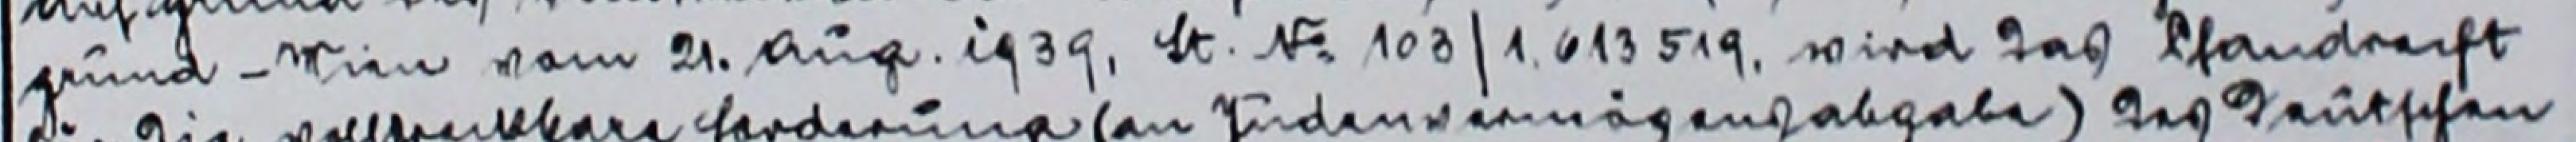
grund - Wien vom 21. Aug. 1937, St. No 103/1.613 519, wird das Pfandrecht
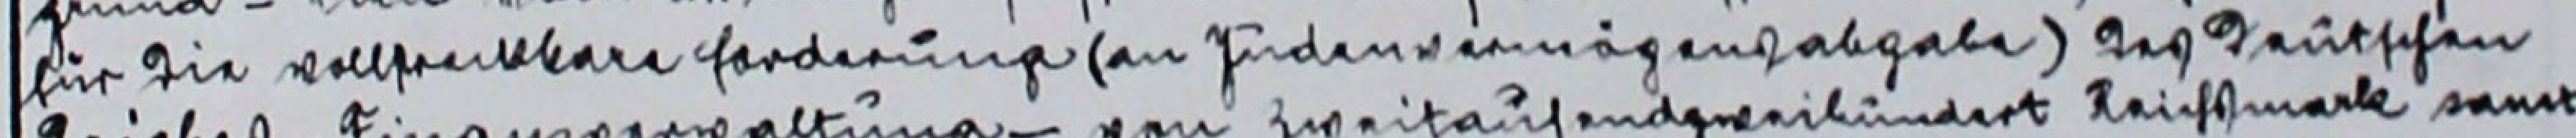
für die vollstreckbare Forderung (an Judenvermögensabgabe) des Deutschen
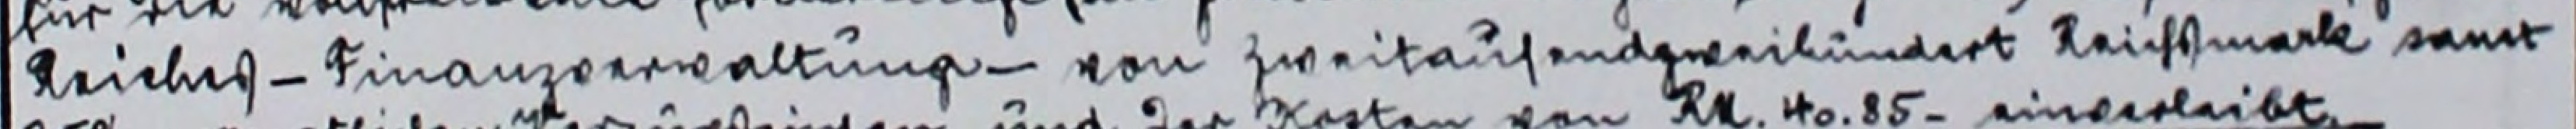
Reiches - Finanzverwaltung - von Zweitausendzweihundert Reichsmark samt
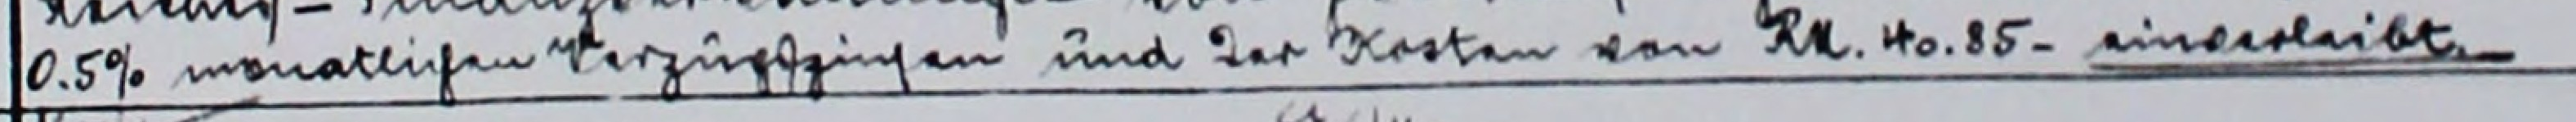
0.5 % monatlichen Verzugszinsen und der Kosten von Rm. 40. 85 - einverleibt.
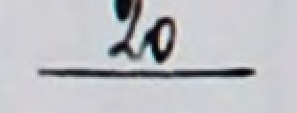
20
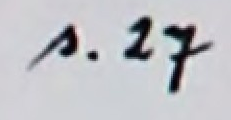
s. 27
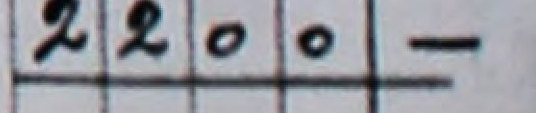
2200 -
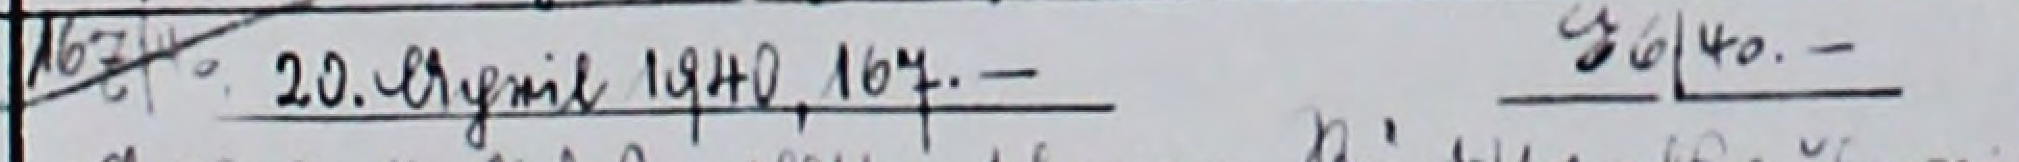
167/40 20. April 1940, 167.- E 6/40.-
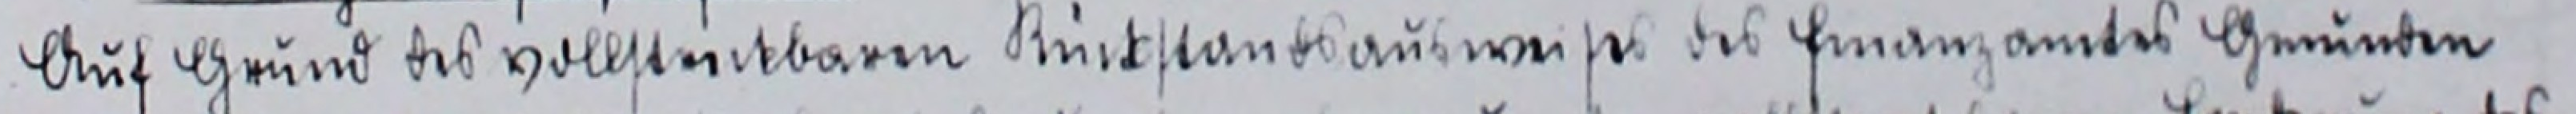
Auf Grund des vollstreckbaren Rückstandsausweises des Finanzamtes Gmunden
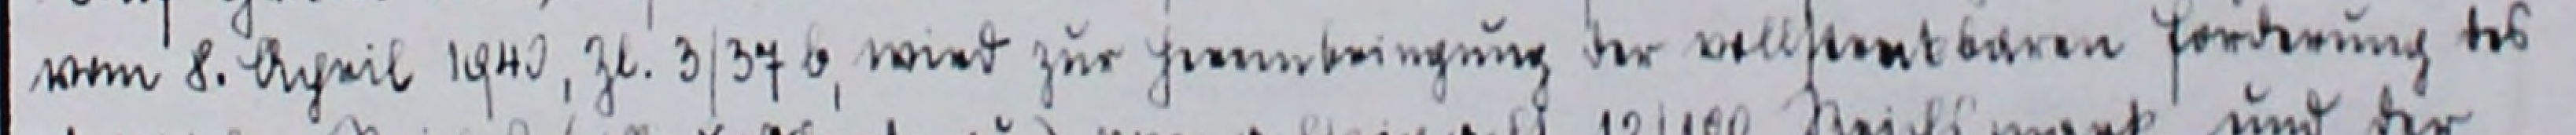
vom 8. April 1940, Zl. 3/37 b, wird zur Herembeingung der vollstreckbaren Forderung des
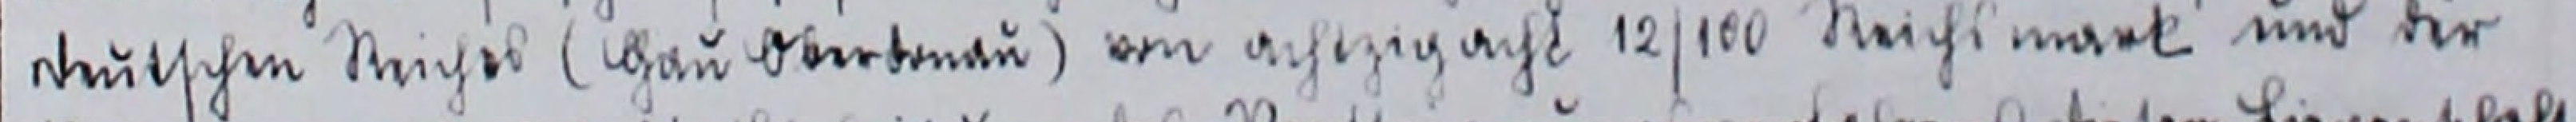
Deutschen Reiches (Gau Oberdonau) von achtzigacht 12/100 Reichsmark und der
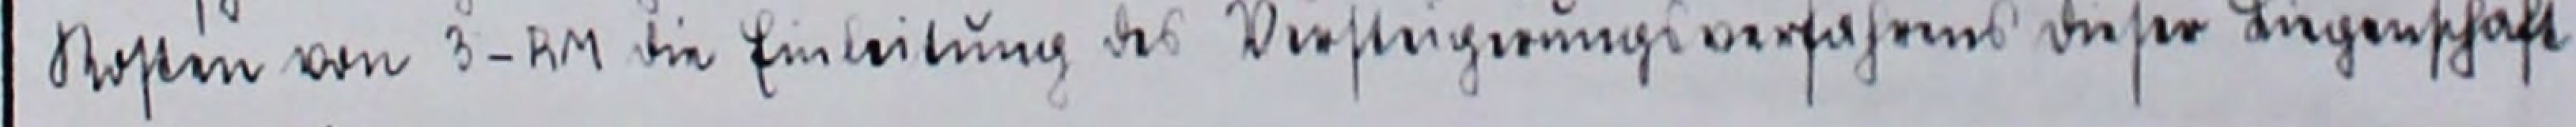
Rosten von 3 - RM die Einleitung des Versteigerungsverfahrens dieser Liegenschaft
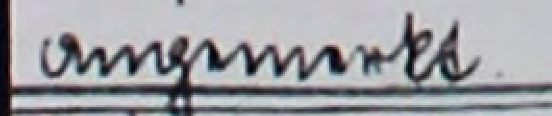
angemerkt.
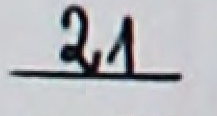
21
